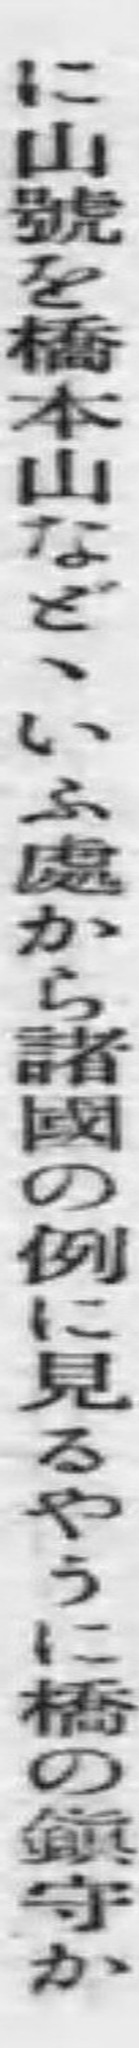に山号を橋本山などゝいふ処から諸国の例に見るやうに橋の鎮守か
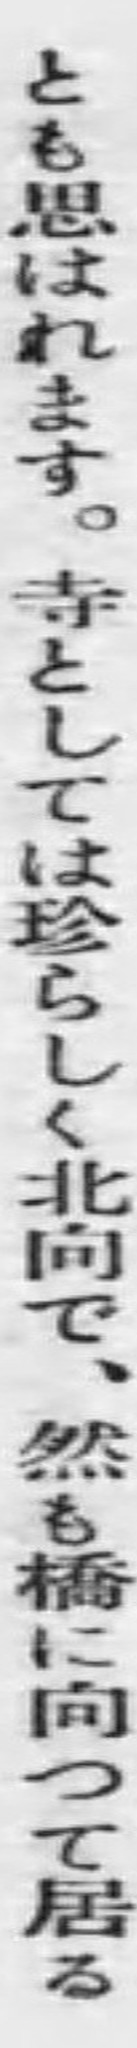とも思はれます。寺としては珍らしく北向で、然も橋に向つて居る
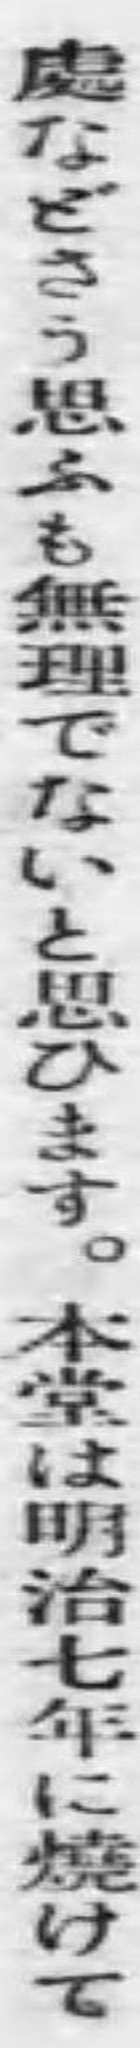処などさう思ふも無理でないと思ひます。本堂は明治七年に焼けて
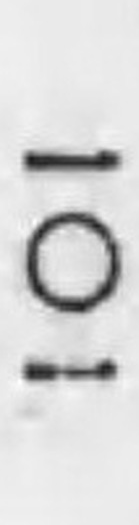一〇一

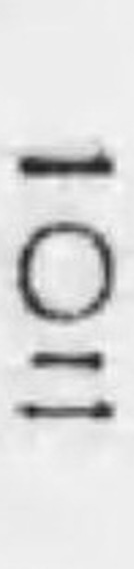一〇二
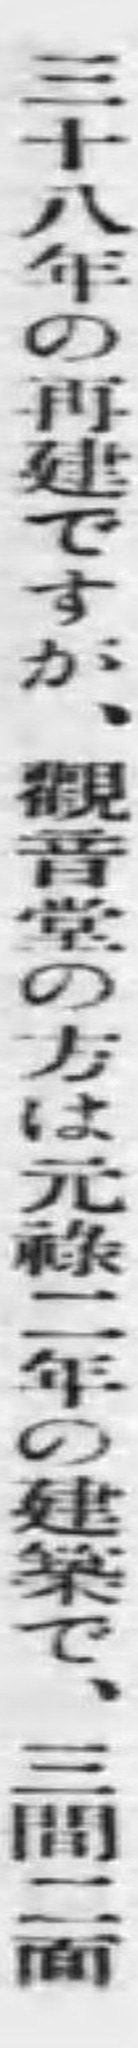三十八年の再建ですが、観音堂の方は元禄二年の建築で、三間二面
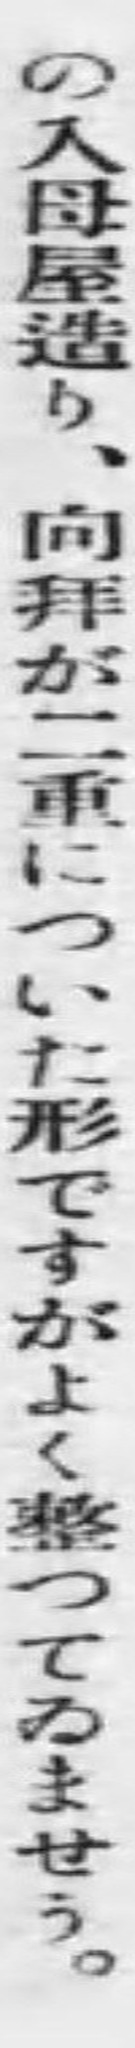の入母屋造り、向拝が二重についた形ですがよく整つてゐませう。
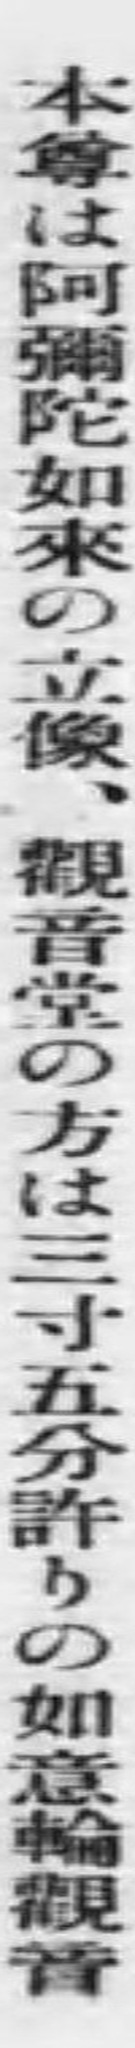本尊は阿弥陀如来の立像、観音堂の方は三寸五分許りの如意輪観音
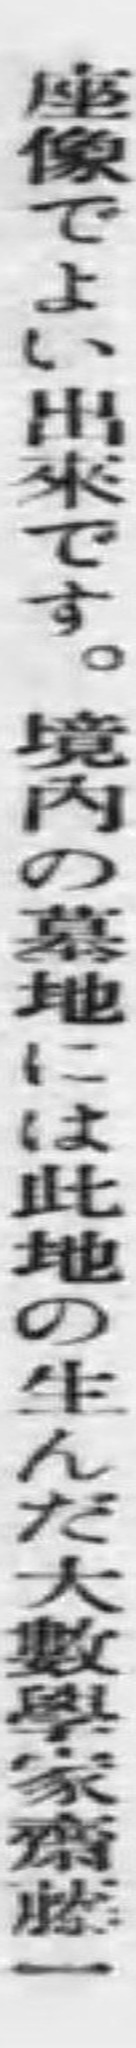座像でよい出来です。境内の墓地には此地の生んだ大数学家斎藤一
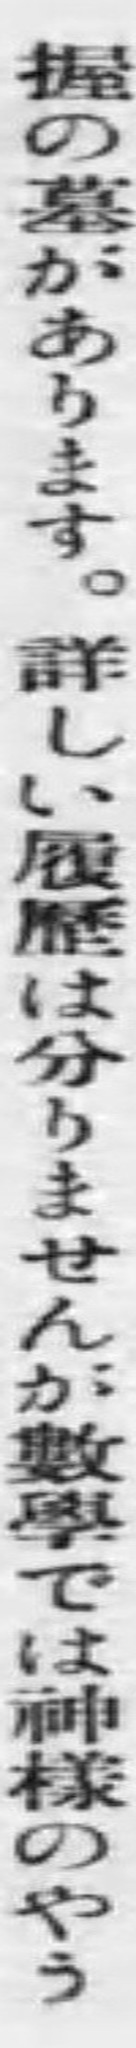握の墓があります。詳しい履歴は分りませんが数学では神様のやう
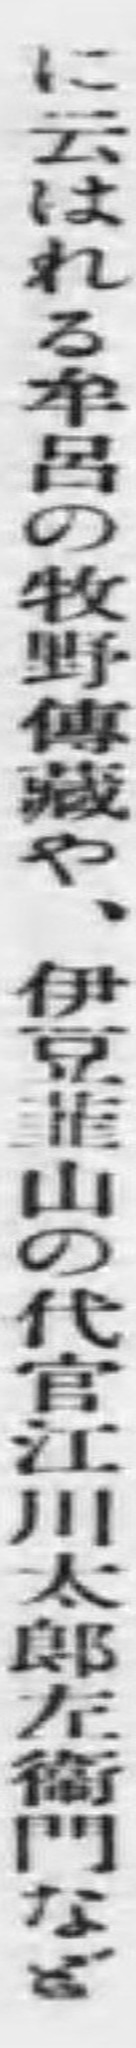に云はれる牟呂の牧野伝蔵や、伊豆韮山の代官江川太郎左衛門など
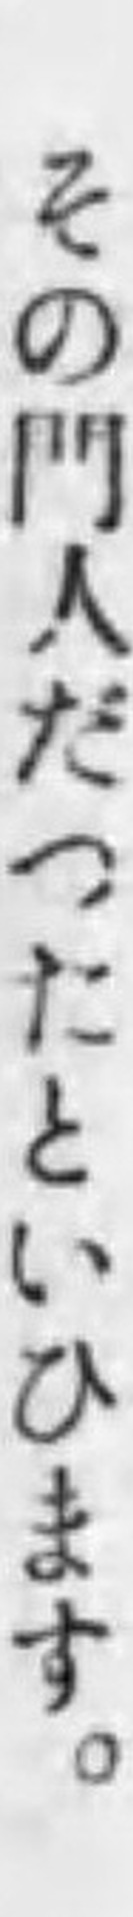その門人だつたといひます。
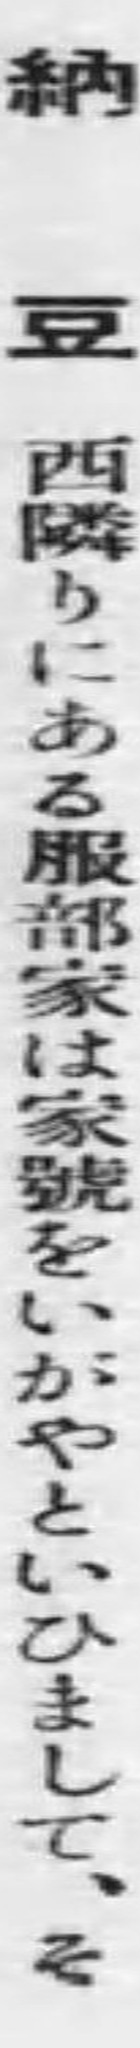納豆西隣りにある服部家は家号をいがやといひまして、そ
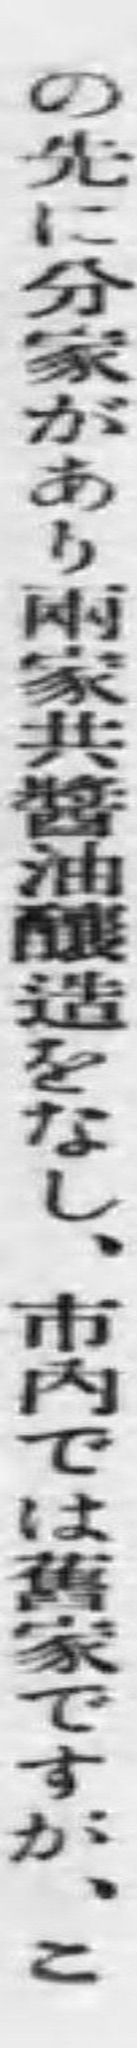の先に分家があり両家共醤油醸造をなし、市内では旧家ですが、こ
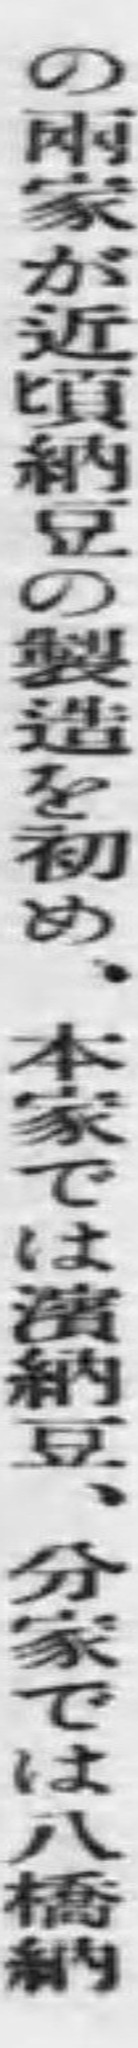の両家が近頃納豆の製造を初め、本家では浜納豆、分家では八橋納
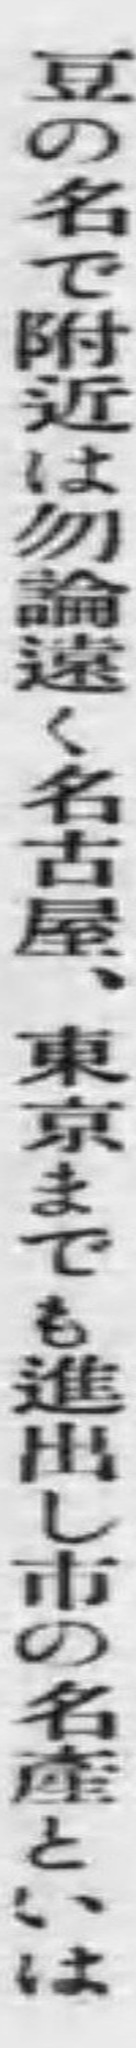豆の名で附近は勿論遠く名古屋、東京までも進出し市の名産といは
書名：東三河道中記 : 豊橋市及其附近案内
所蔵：国立国会図書館 National Diet Library, JAPAN
